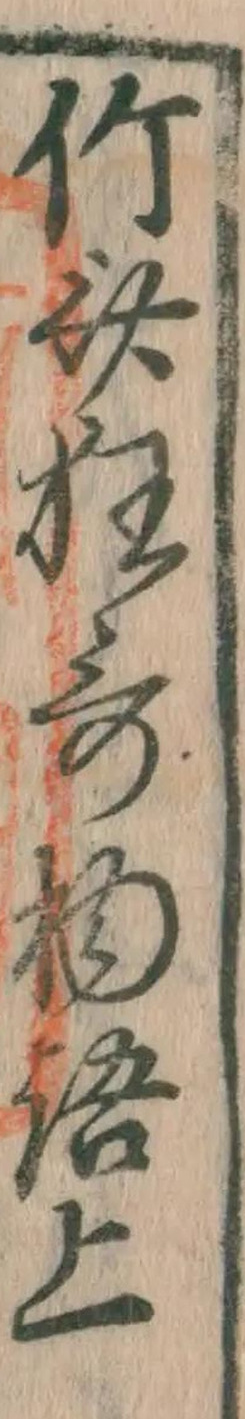竹斎狂歌物語上
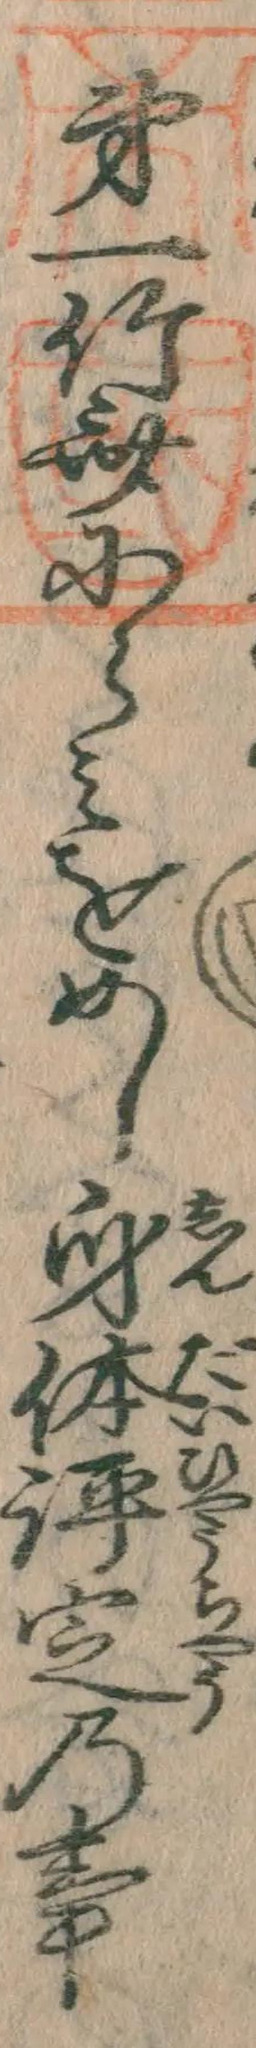第一竹斎にらみをめし身体評定の事
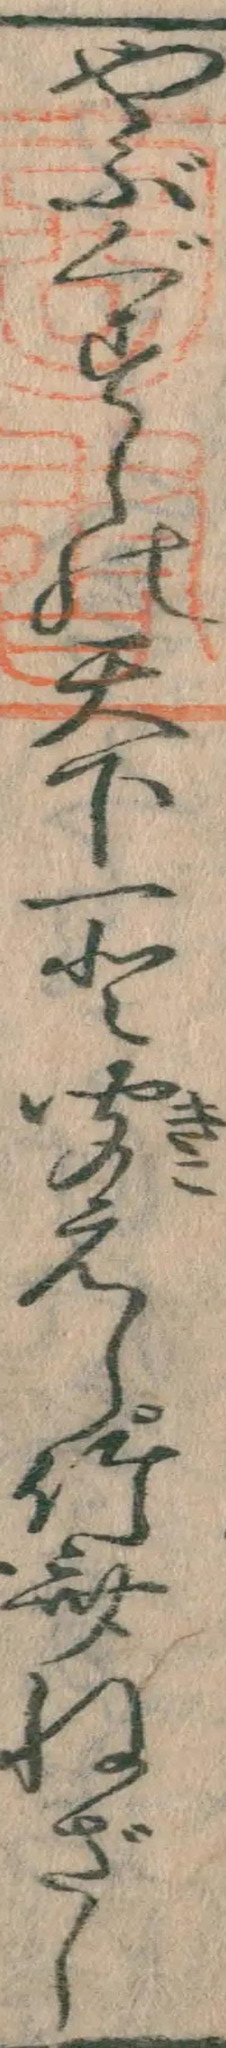やぶぐすしの天下一と聞えし。竹斎ねざし
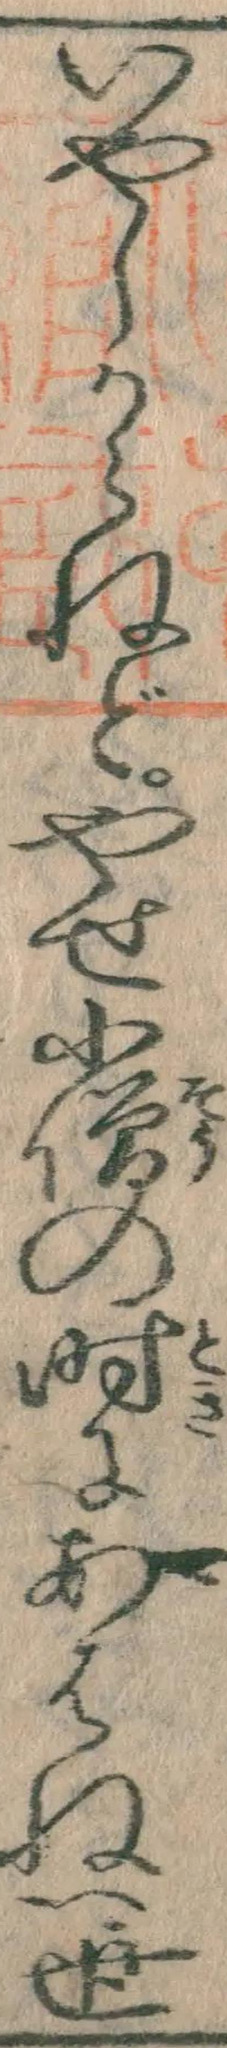いやしからねど。やせ小僧の時にあはねは世
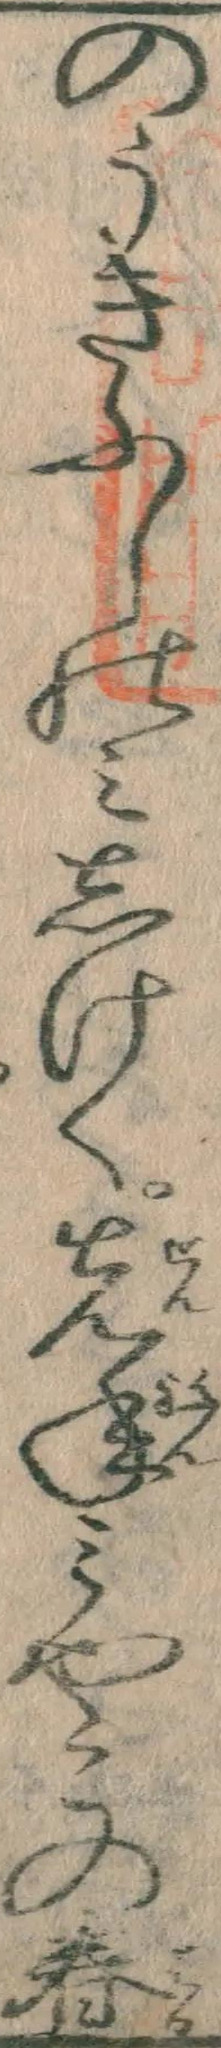のうきふしのみしけく。先年みやこの春
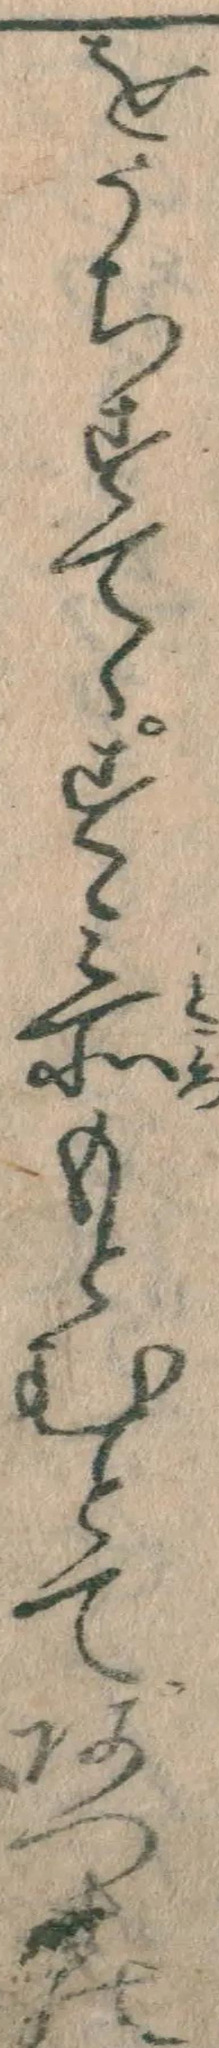をうちすてゝ。すみ所もとむとて。あつまの
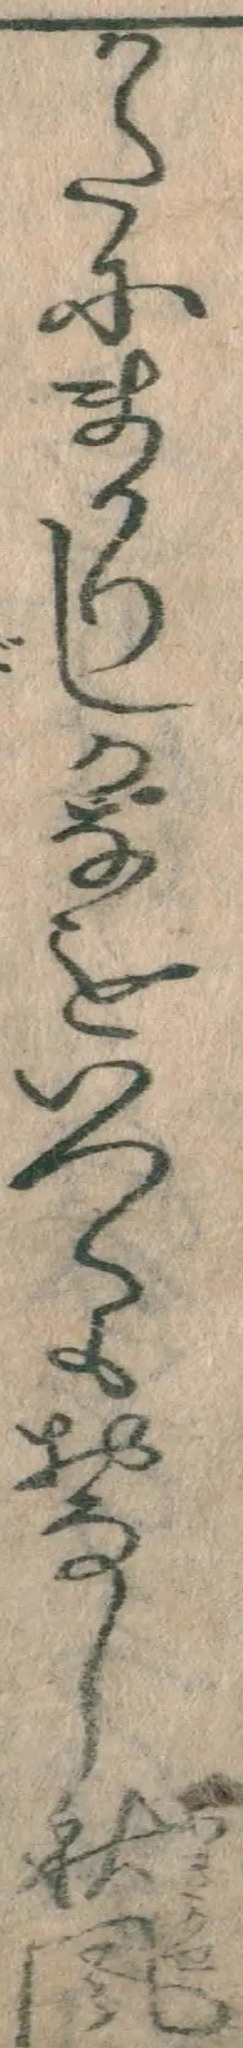かたにまかりしか、なをいつくもおなし秋風
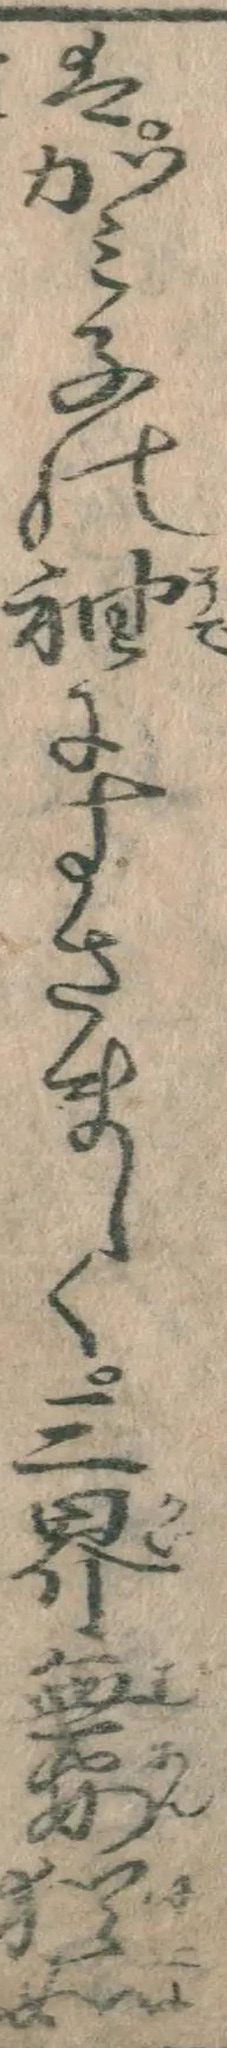は。かみこの袖にすさましく。三界無安猶如
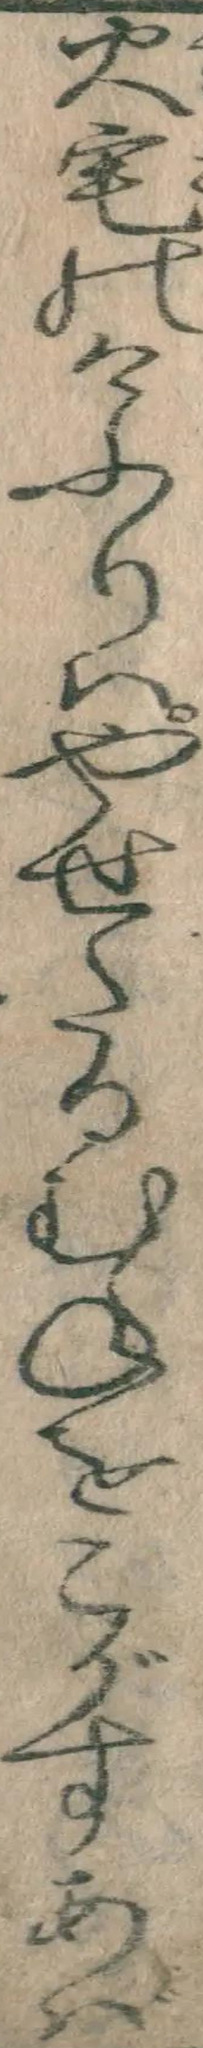火宅のけふりは。やせたるむねをこがすあば
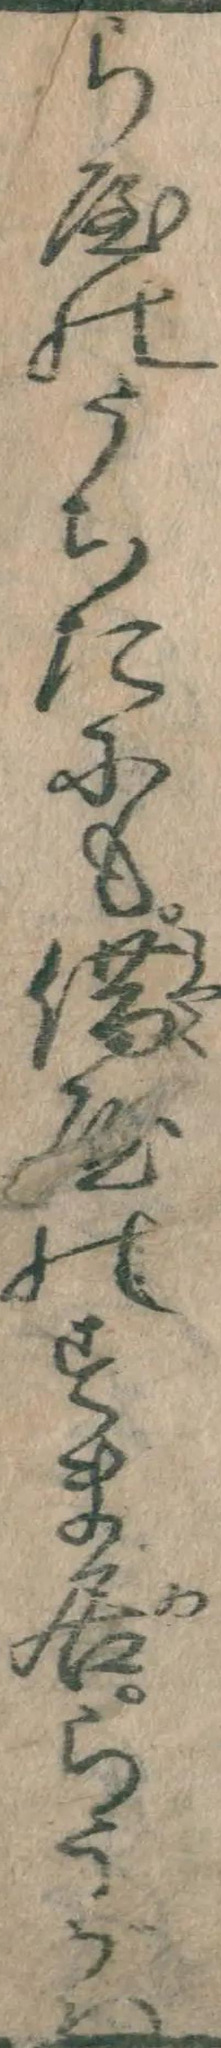ら屋のうちたにも。借家のすま居。らうがは

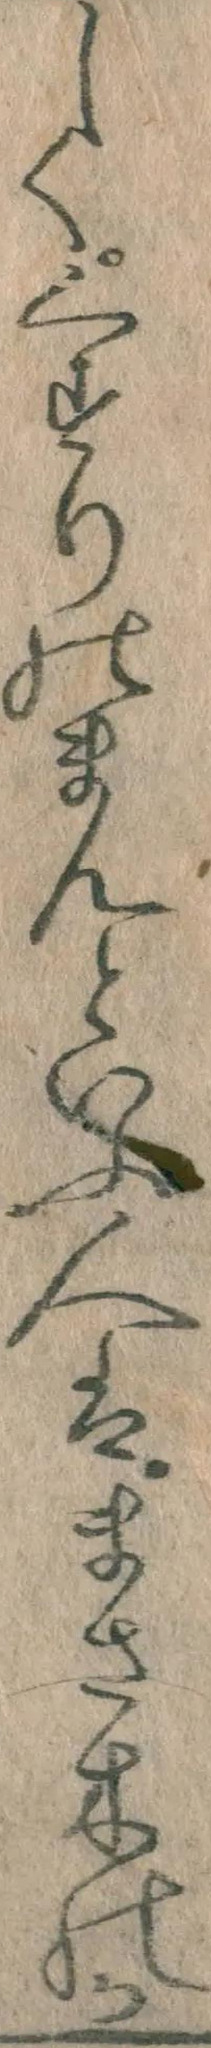しく。くすりのまんといふ人は、まさ木のか
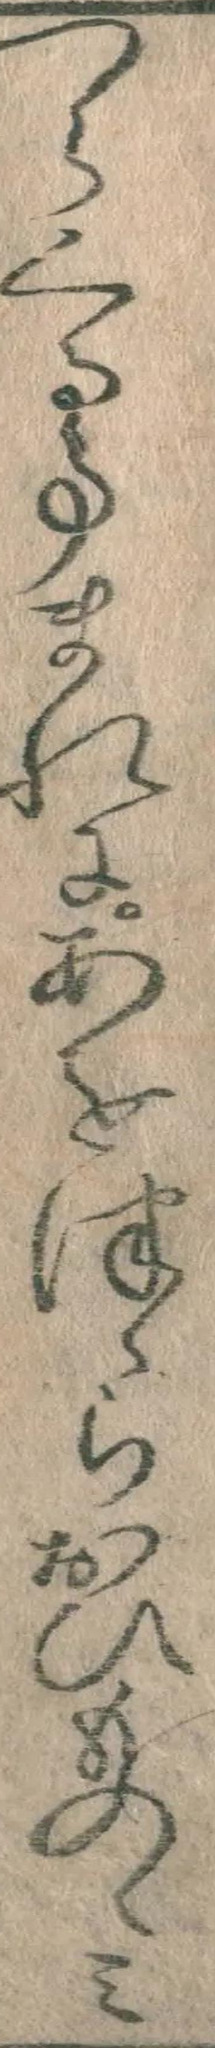つらくる事まれに。あをつゝらおひものゝみ
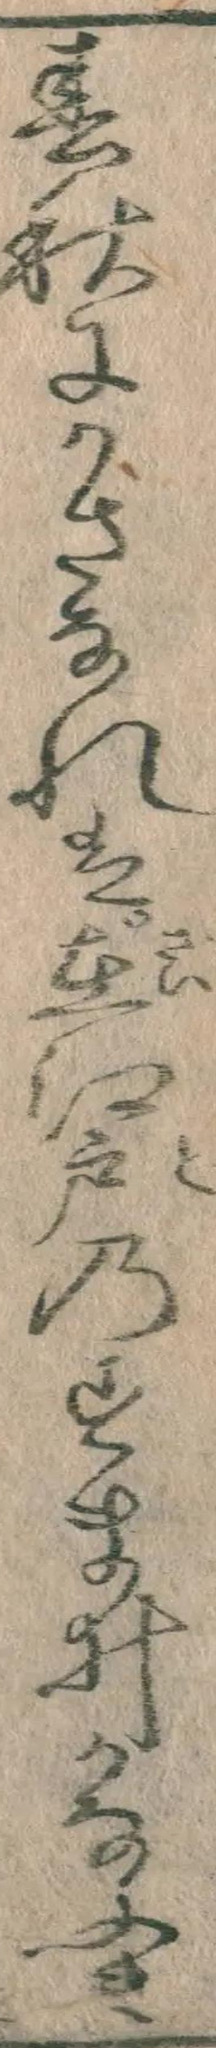春秋にかさなれは。在江戸のすまゐかなふま
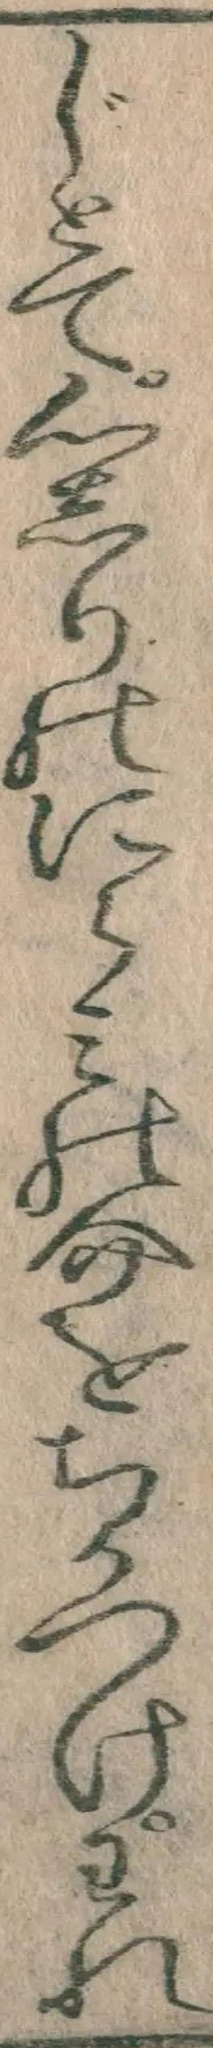じとて。心しりのにらみの介ちかつけ。われ
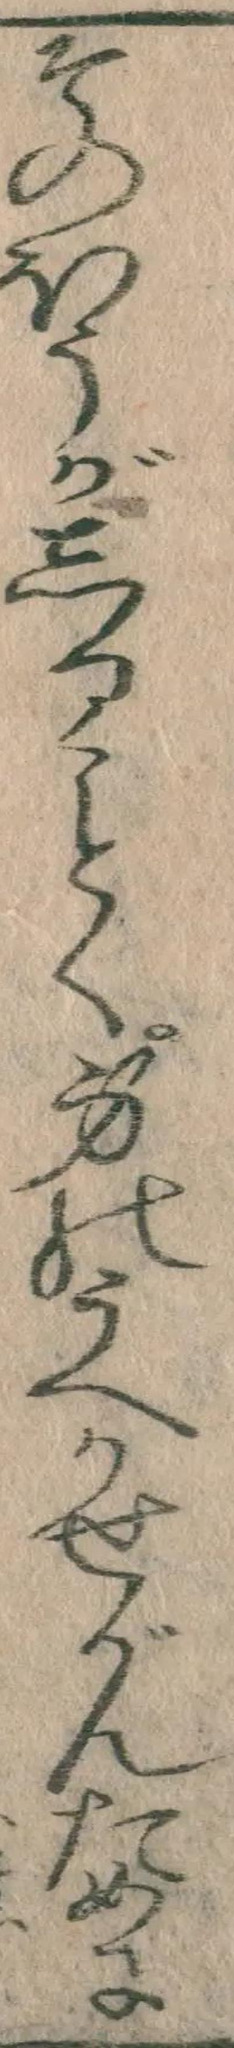そのほうがしることく。身のうへかせがんために
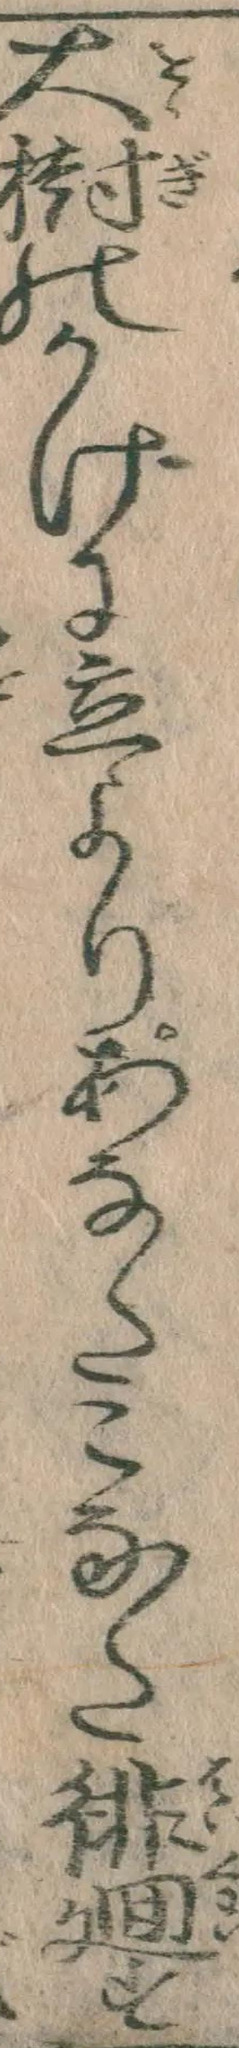大樹のかけに立より。あなたこなた徘廻す
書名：竹斎狂歌物語 3巻
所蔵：国立国会図書館 National Diet Library, JAPAN
